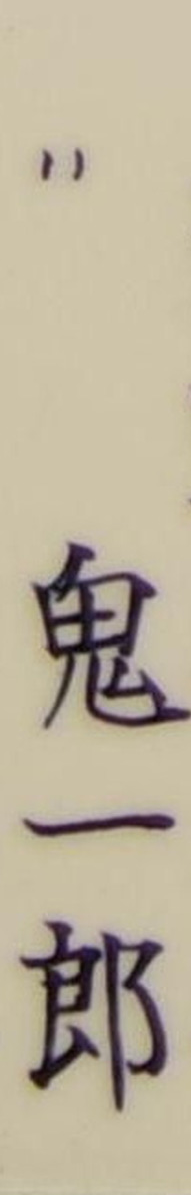鬼一郎
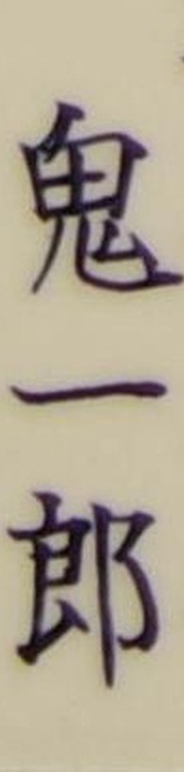鬼一郎

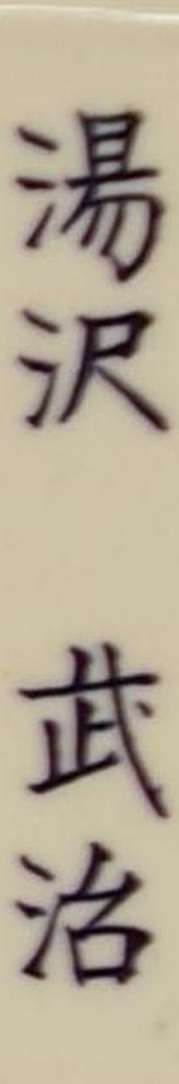湯沢武治
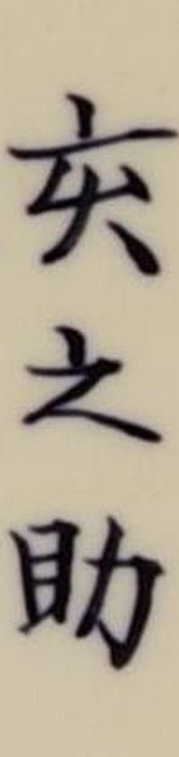亥之助
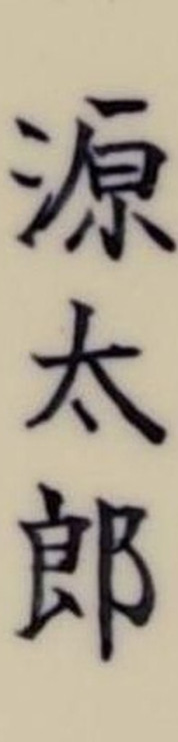源太郎
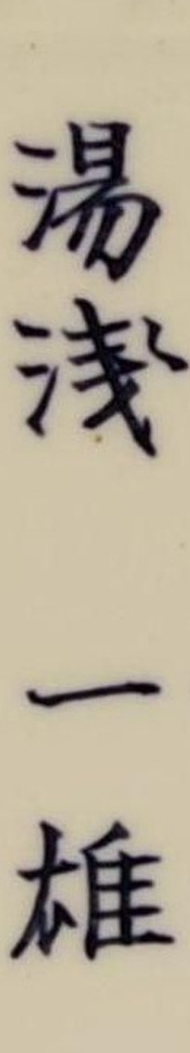湯浅一雄
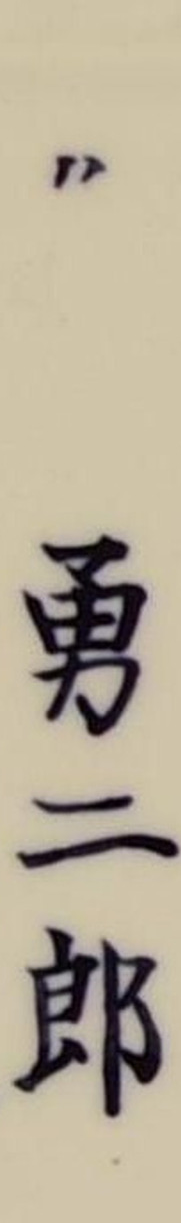勇二郎
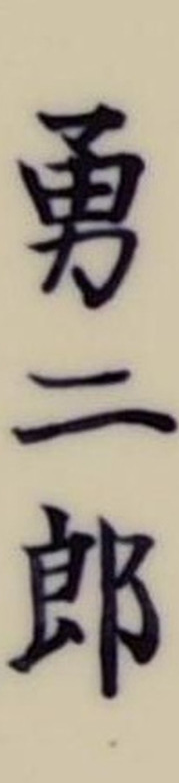勇二郎
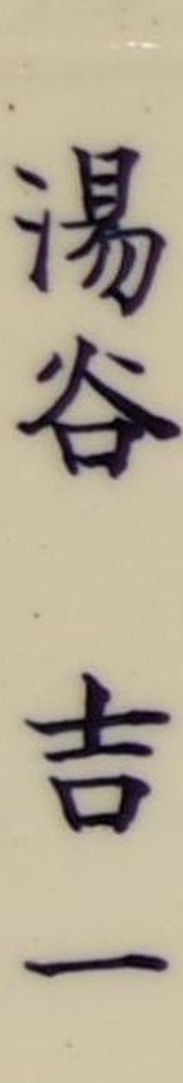湯谷吉一
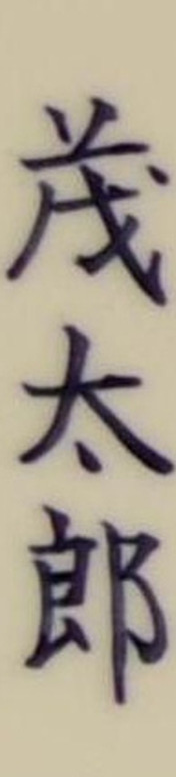茂太郎
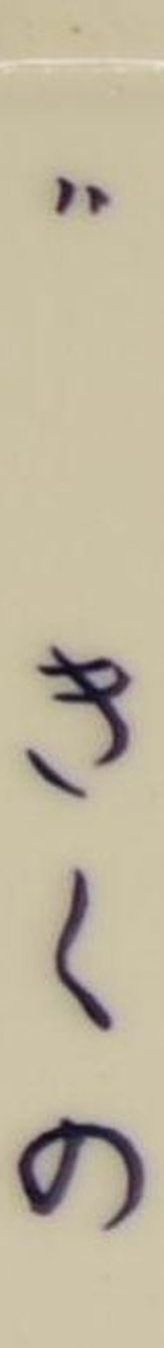きくの
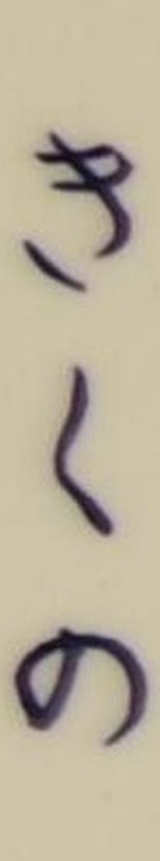きくの
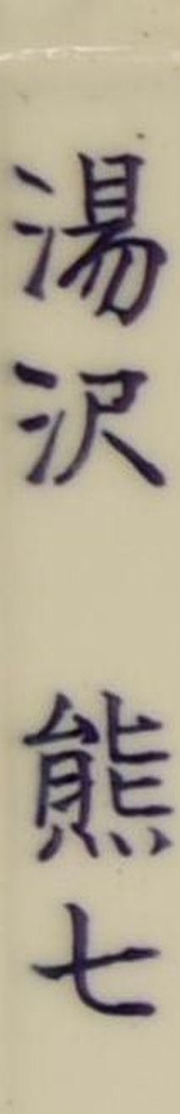湯沢熊七

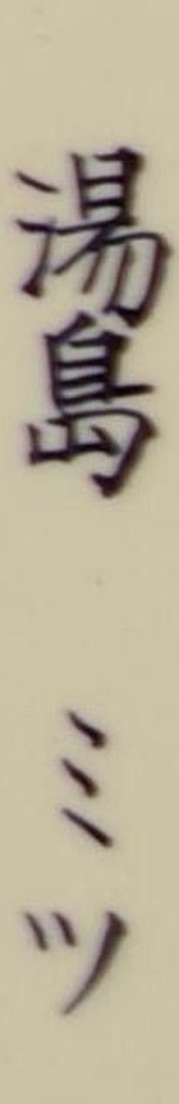湯島ミツ
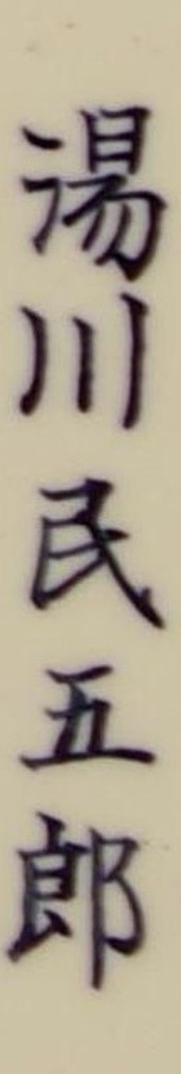湯川民五郎
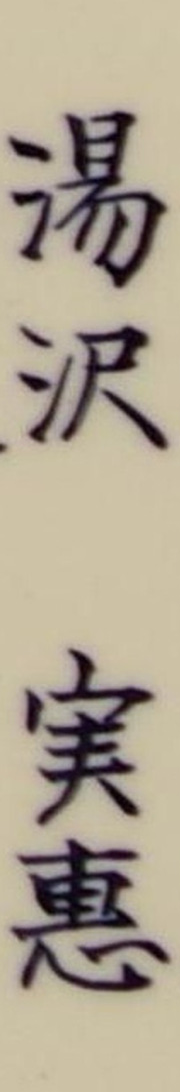湯沢実恵
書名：E~L
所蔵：高野山金剛峯寺
